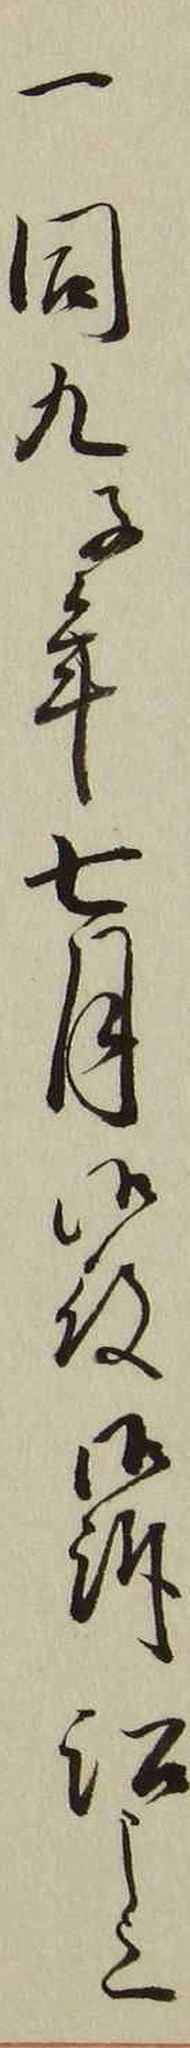一同九子年七月御役御訴訟申上
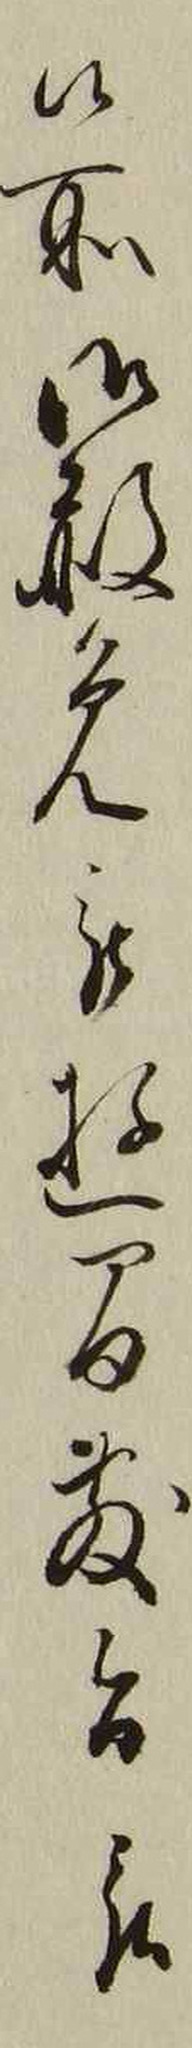候所御赦免被遊間敷旨被
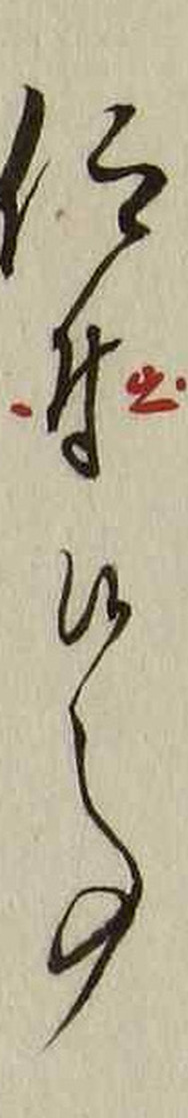仰付候事
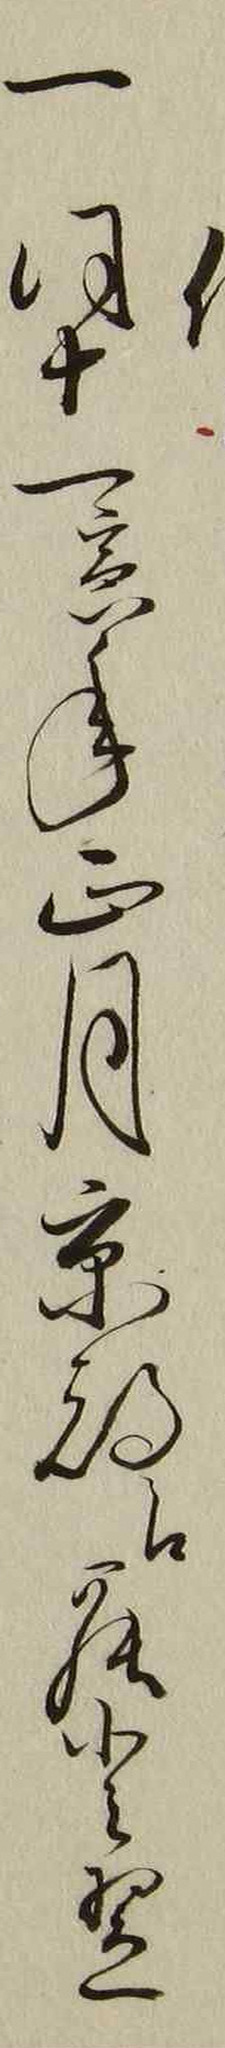一同十一寅年正月京都江罷登翌
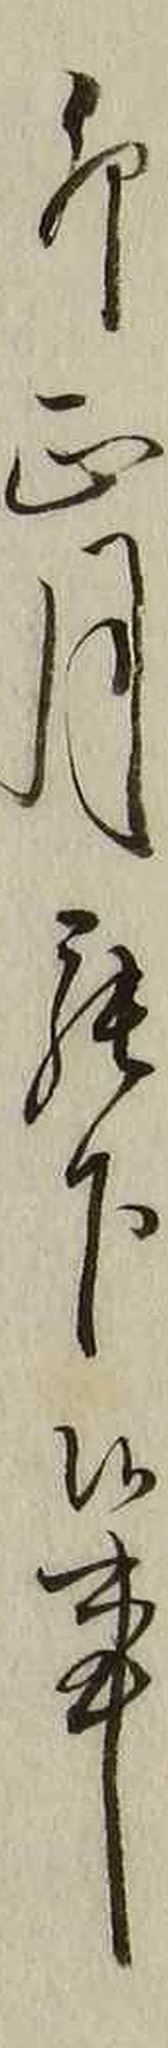卯正月罷下候事
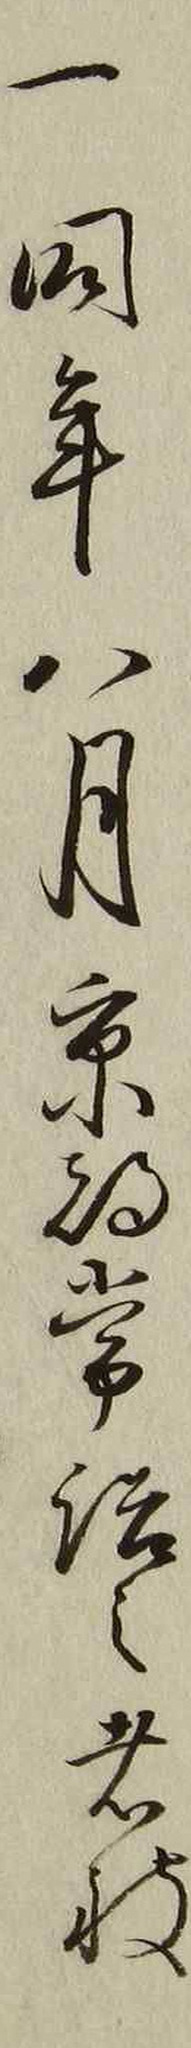一同年八月京都常詰之者被
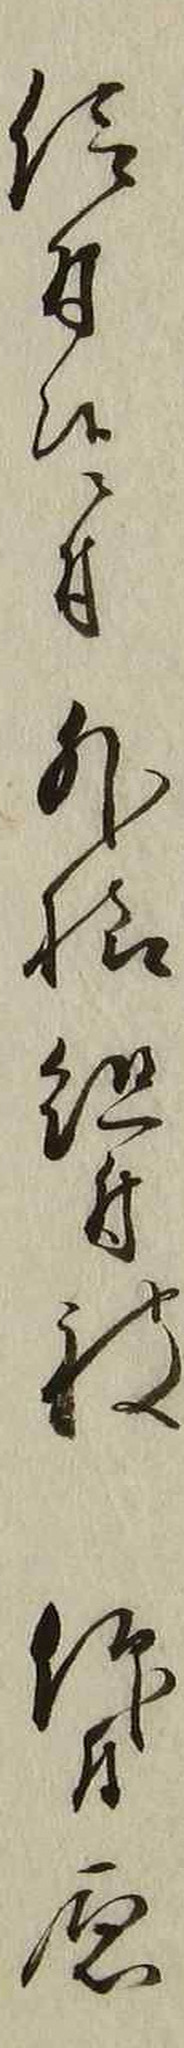仰付候ニ付外様組付被仰付原
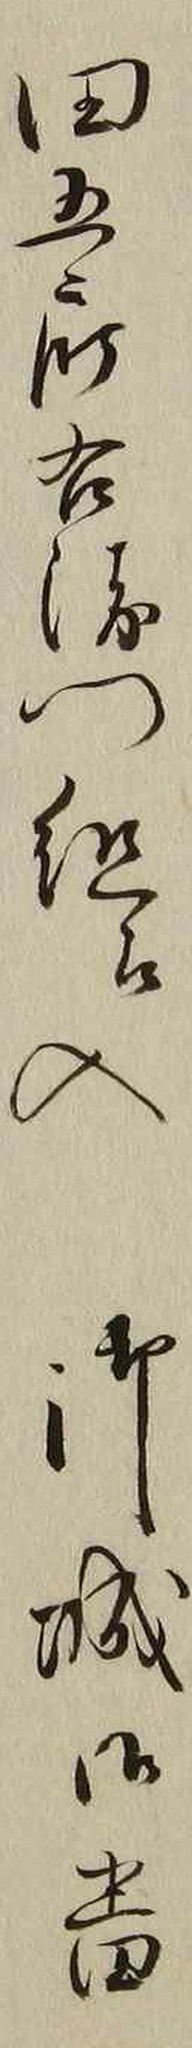田五郎右衛門組江入御城御番
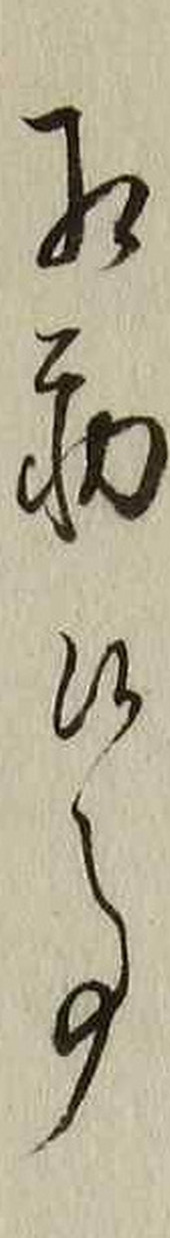相勤候事
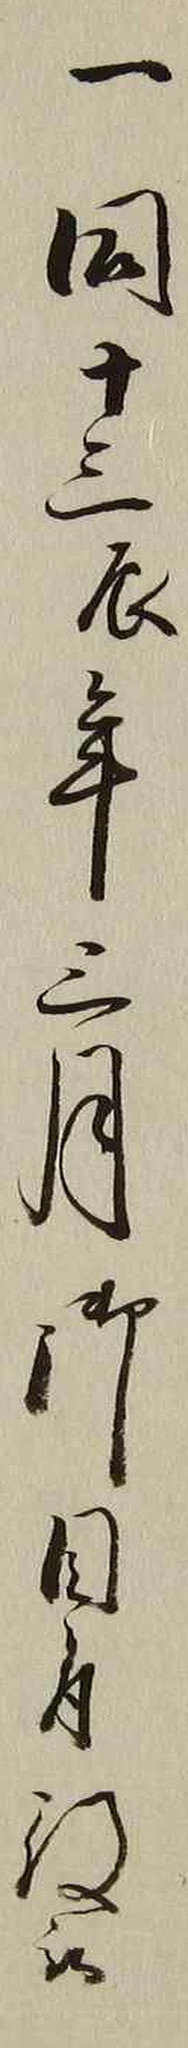一同十三辰年三月御目付役被
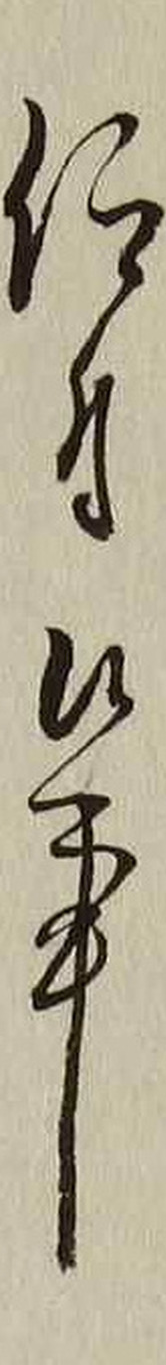仰付候事
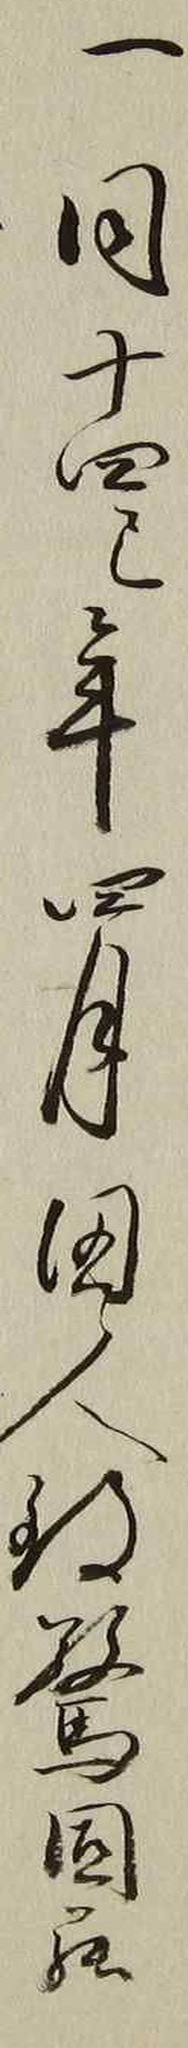一同十四巳年四月囚人致驚固罷
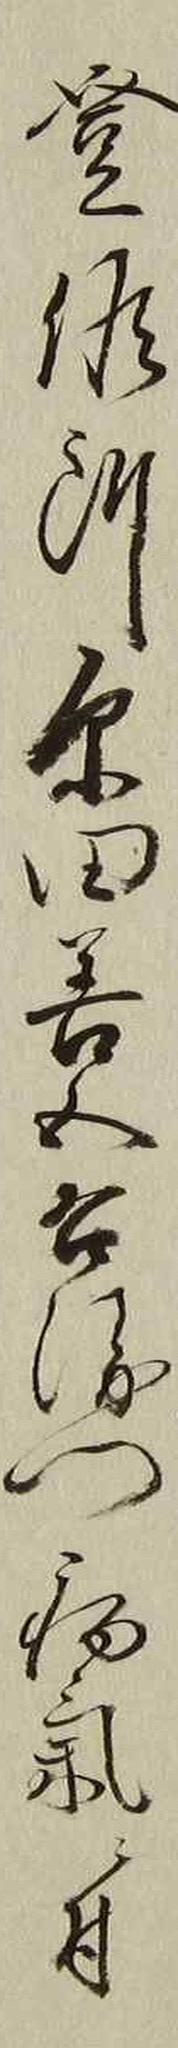登候所原田善五右衛門病気ニ付
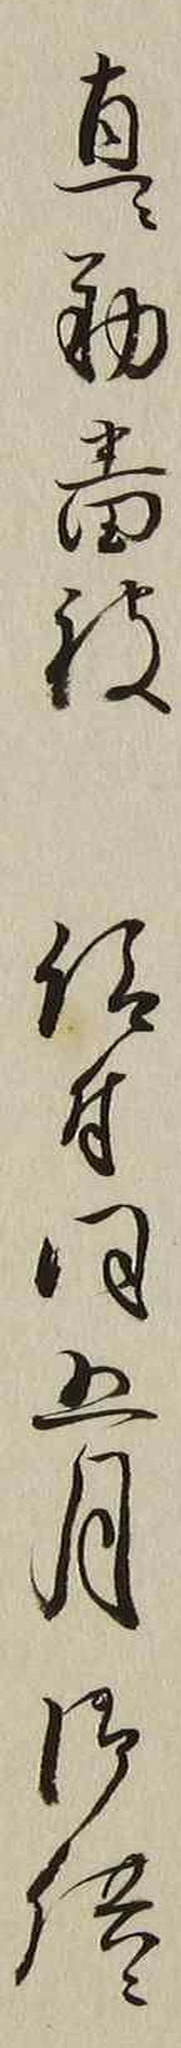直ニ勤番被仰付同五月御供ニ
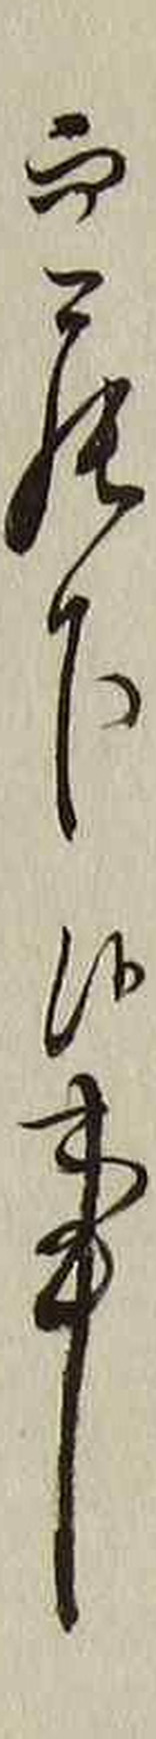而罷下候事
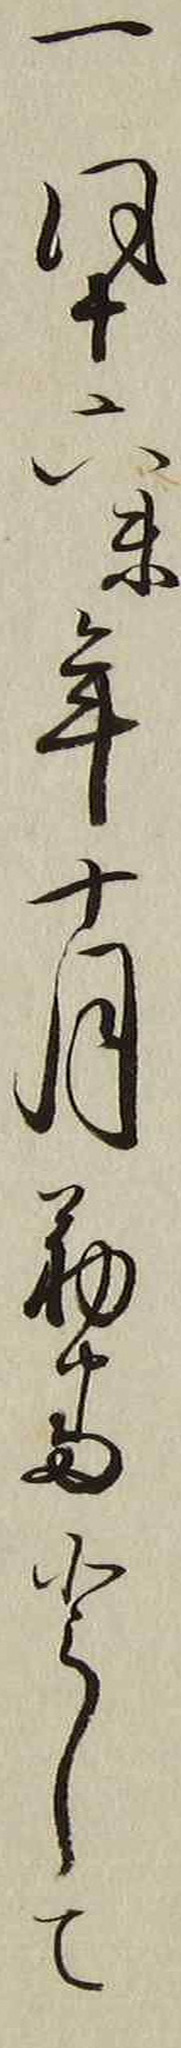一同十六未年十月勤番として
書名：諸士系譜　巻之2　い之部2
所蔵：会津若松市立会津図書館
